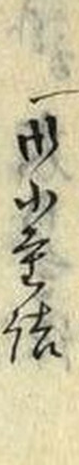御小重詰
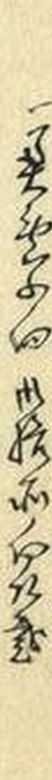奥台子向御膳所向頂戴
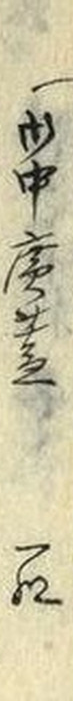御中広蓋一組
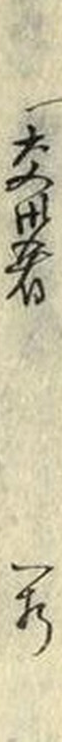交御肴一折
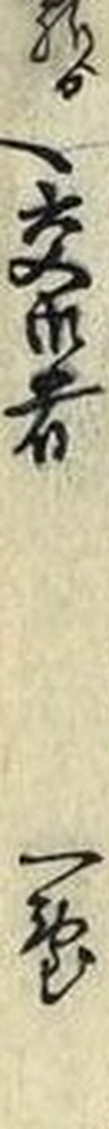交御肴一折

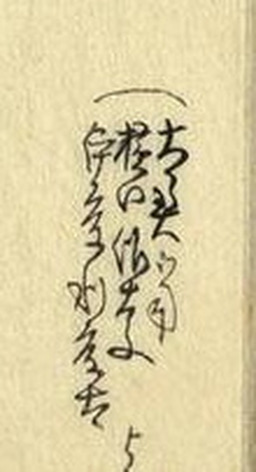横田作太夫
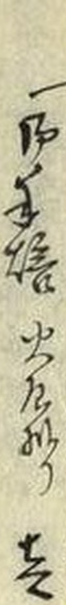御手焙火屋掛り壱

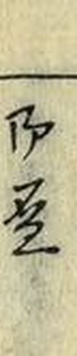御盃壱
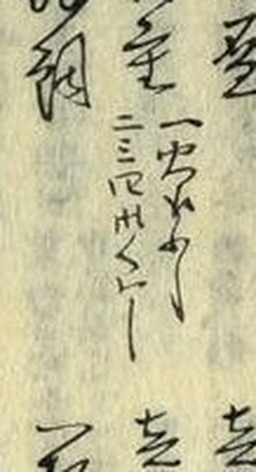二三四御くハし壱
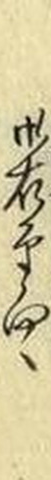御右筆向へ
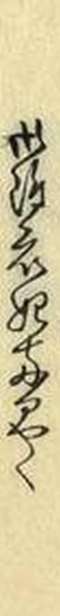御附衆始両部屋へ
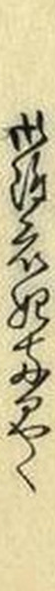御附衆始両部屋へ
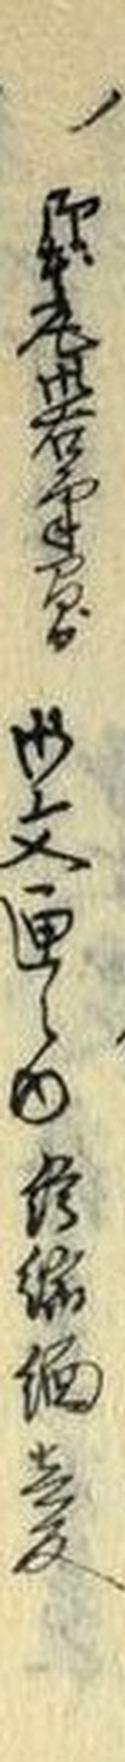ノ御本丸御右筆間ゟ御文匣之内縞縮緬壱反
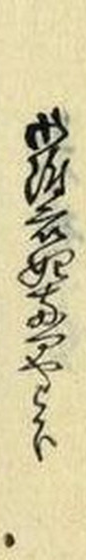御附衆始両部屋へ
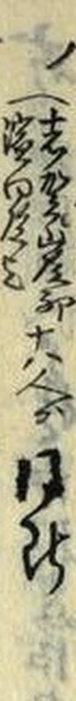浜田殿迄十八人ゟ同断同
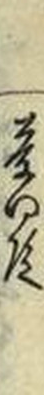藤田殿
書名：少傅日録抄（斉善付側向頭取日記、在府）
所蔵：福井県文書館 Fukui Prefectural Archives
